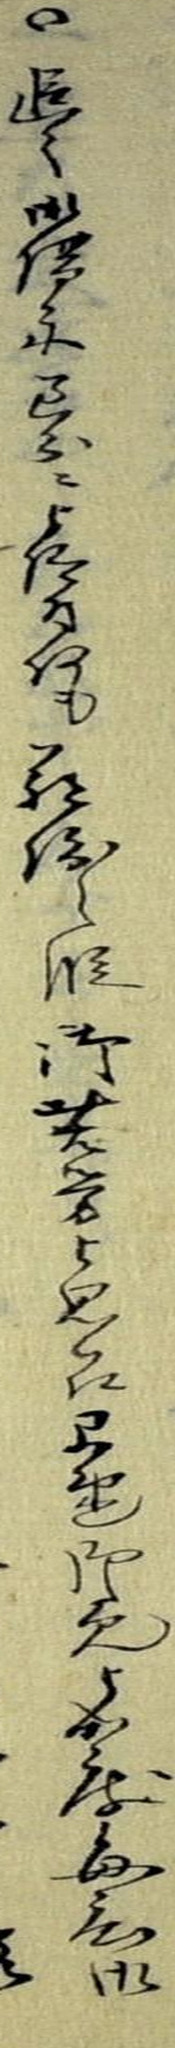〇追々御借米過分ニ被仰付何も難儀之段御苦労被思召早速御免被成度毎度御
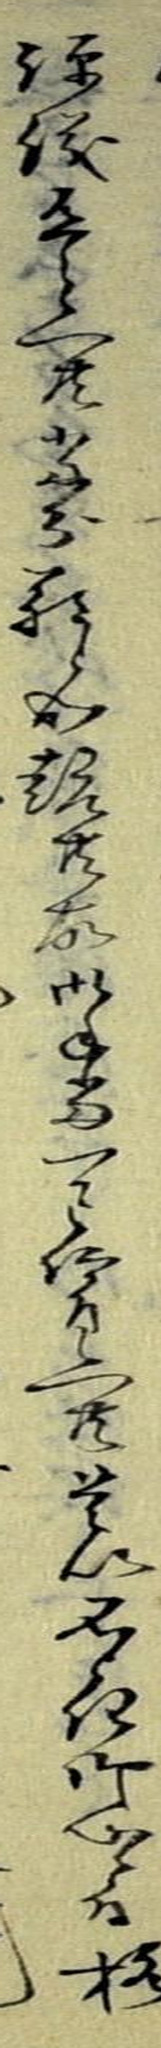評議有之候へ共当分難被成趣共故御手当可被仰付候へ共是以不被任御心候ニ付格
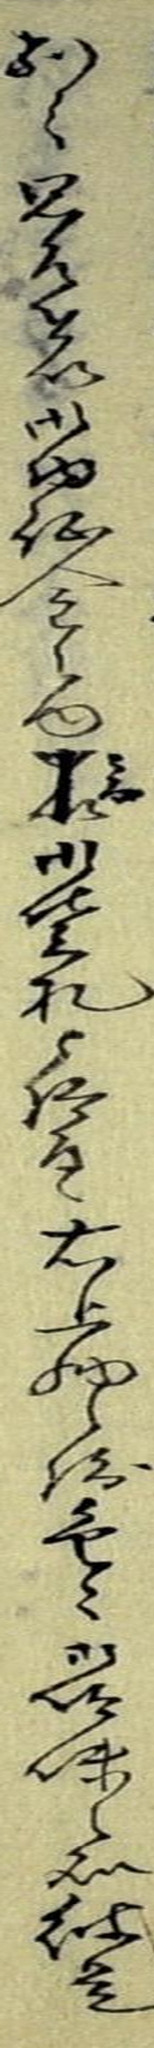別之思召を以御内証金之内ニ而御貸札被仰付候右上納之儀色々御吟味之処彼是
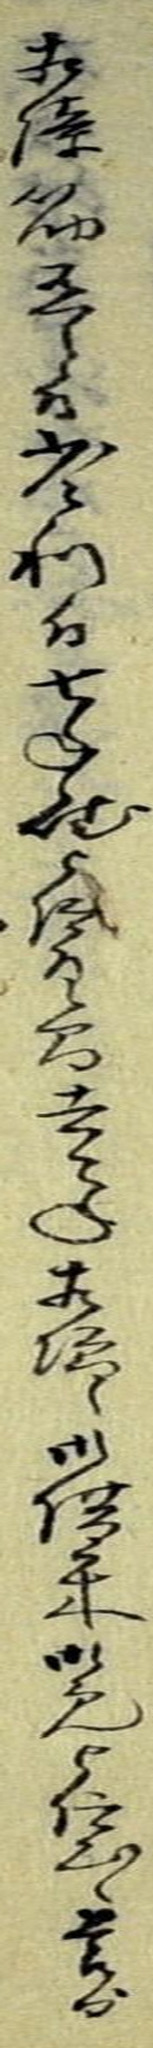相障筋有之ニ付少々利付七年賦被仰付候間去々年相増候御借米御免被仰出候節ゟ
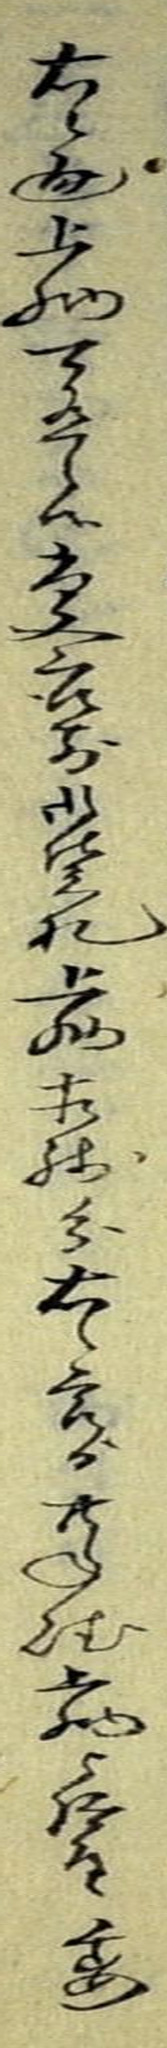右之通上納可有之候尚又最前御貸札上納相残分右之節ゟ廿年賦上納被仰付候委
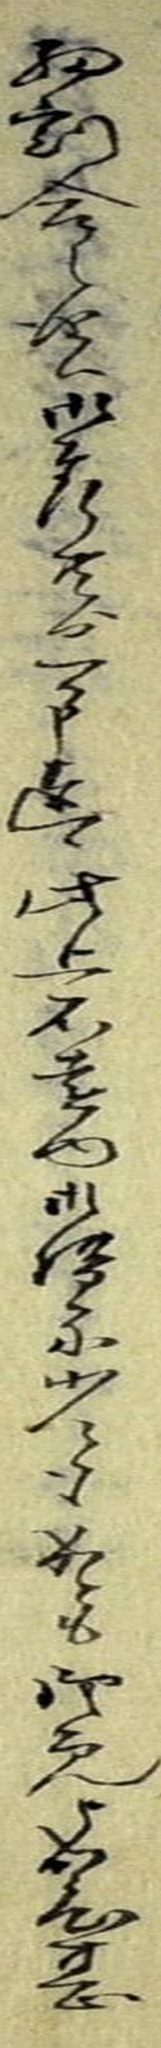細割合之儀ハ御奉行共ゟ可申達候此上不遠内御借米少々ツヽ成とも御免被成度甚
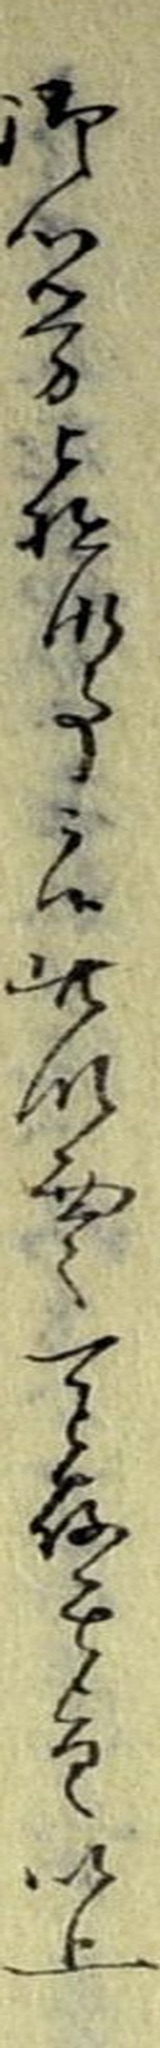御心労被遊御事ニ候此段面々可被存其旨候以上
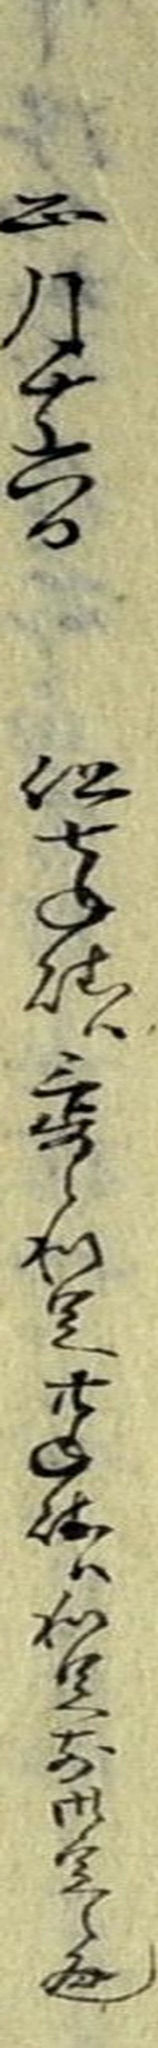正月十六日但七年賦ハ三歩之利足廿年賦ハ利足前御定之通
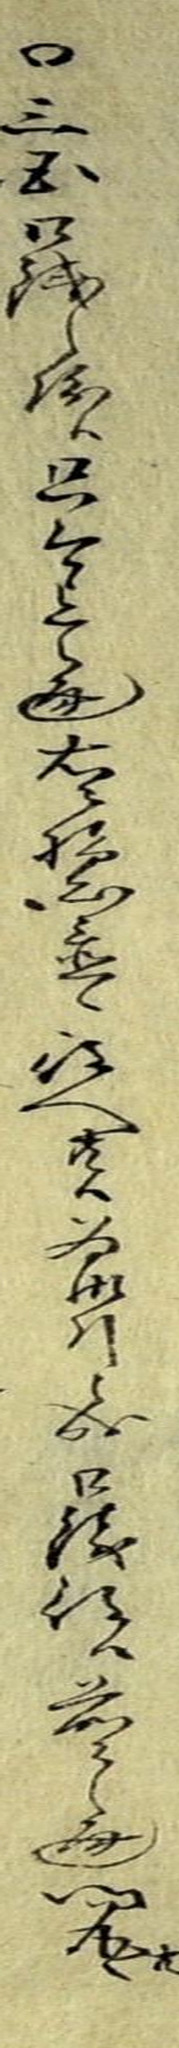〇三国口銭之儀ハ只今迄之通右ニ指出置候役人共ハ為御引被成口銭役ハ前々之通問丸共へ
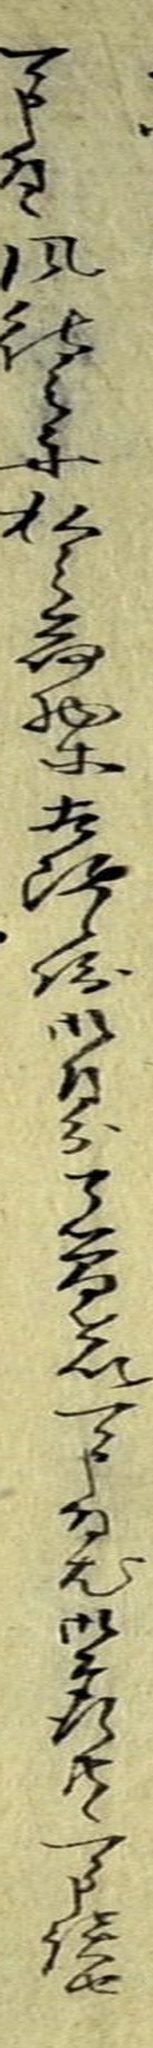可申付候風待之舟私之荷物等相改候儀御自分了簡を以可申付尤御奉行共へ可申談由
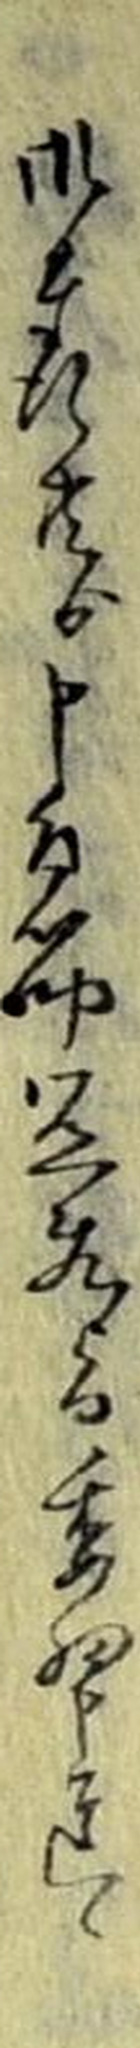御奉行共ゟ申付筋宜敷旨委細申達候
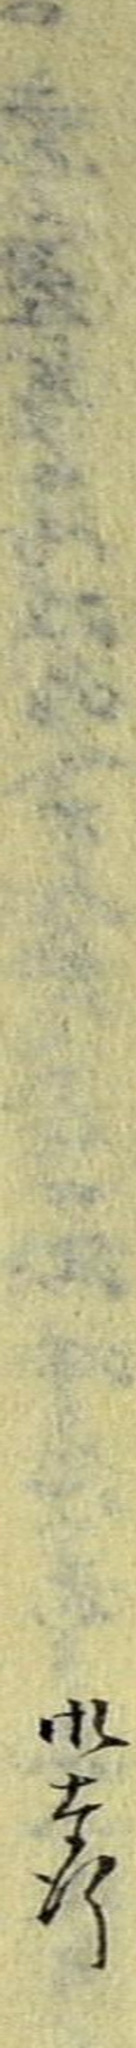御奉行
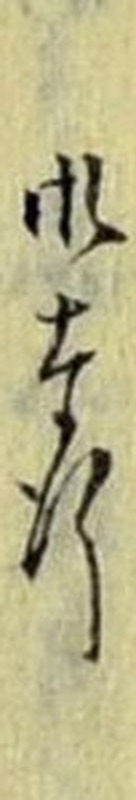御奉行

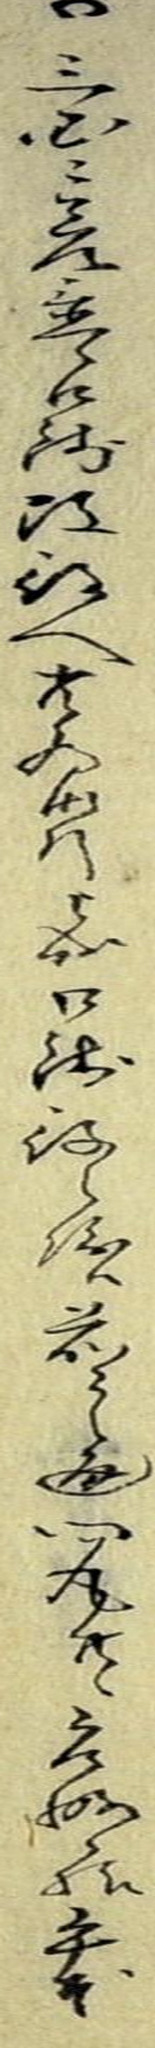〇三国ニ差置候口銭改役人共為御引被成口銭役之儀ハ前々之通問丸共へ取扱候様平本
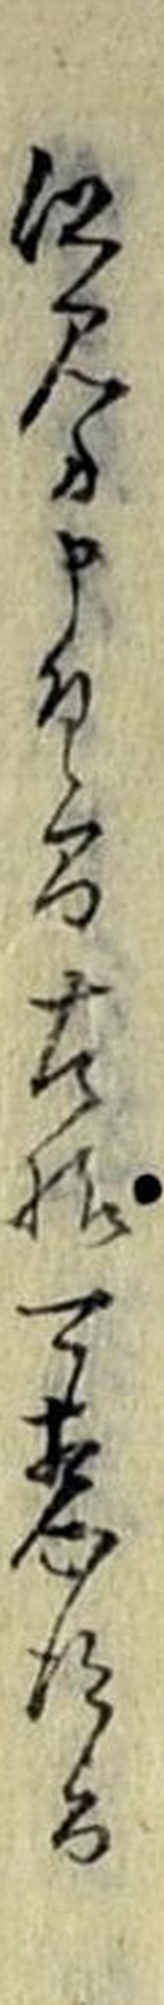但見方申付候間左様可相心得旨
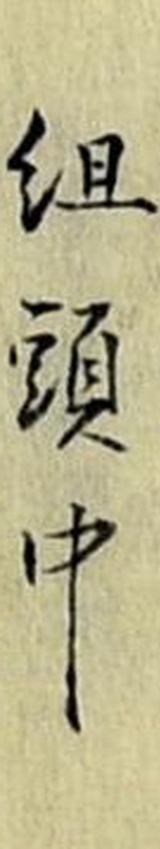組頭中
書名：命令之部 一
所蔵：福井県文書館 Fukui Prefectural Archives
